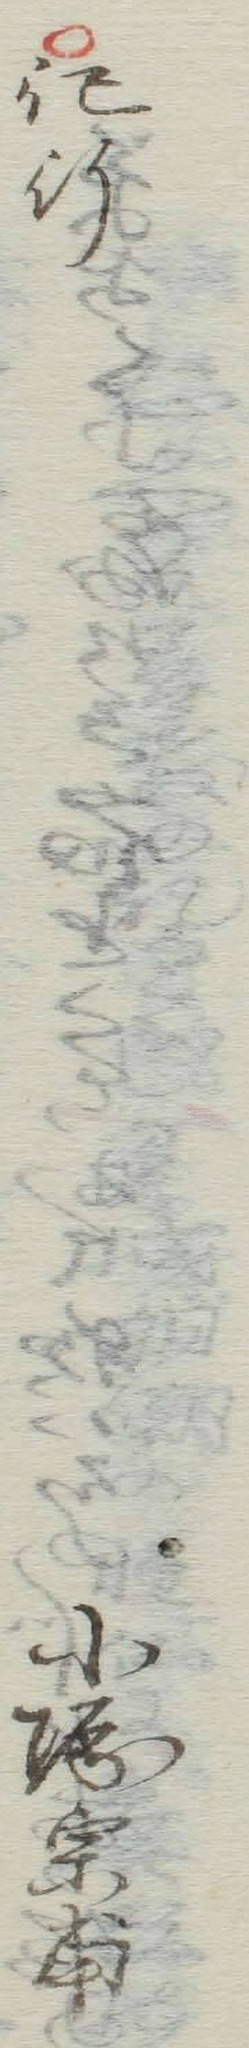○紀行小堀宗甫
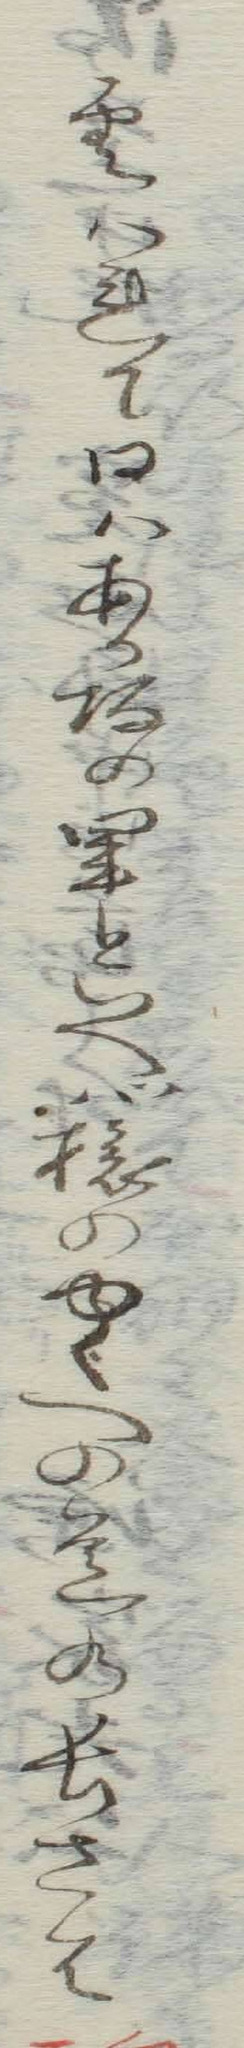雲はれて日はあか坂の里といへば旅のゆくへの道の長さは白モ
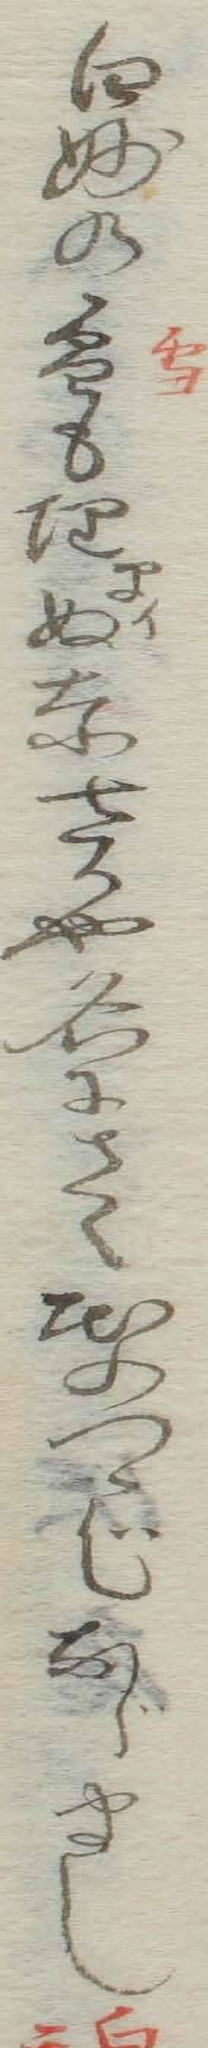白妙の雪も埋ぬ赤さかや名にさく花のつゝじならまし白モ
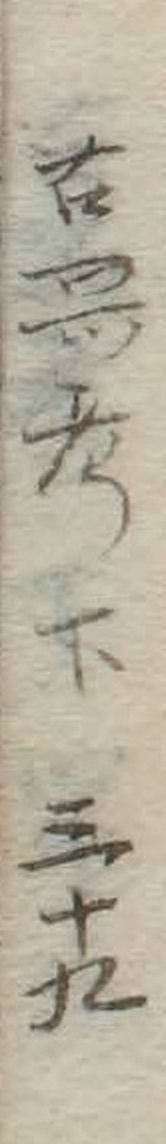古歌考下三十九

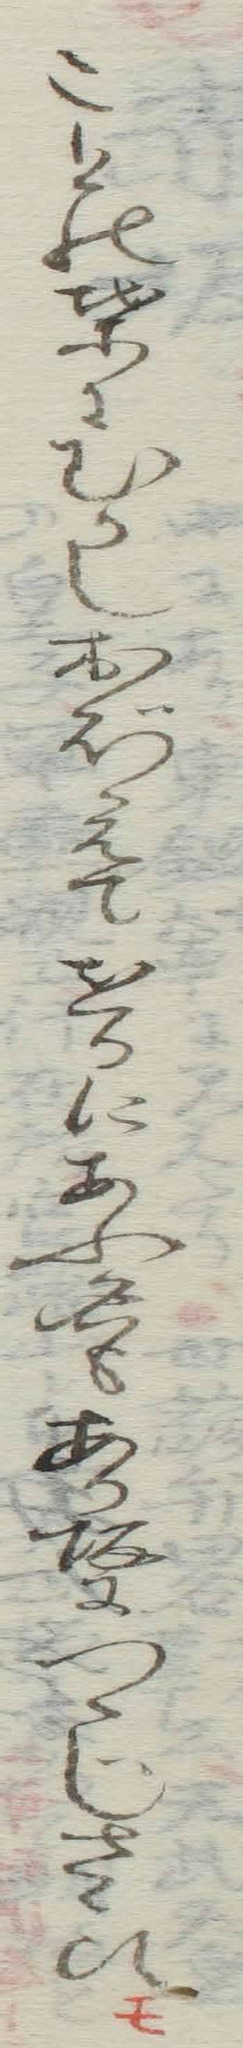ことの葉にむかしおぼえてをりにあふ名もあか坂につゝじさく頃モ
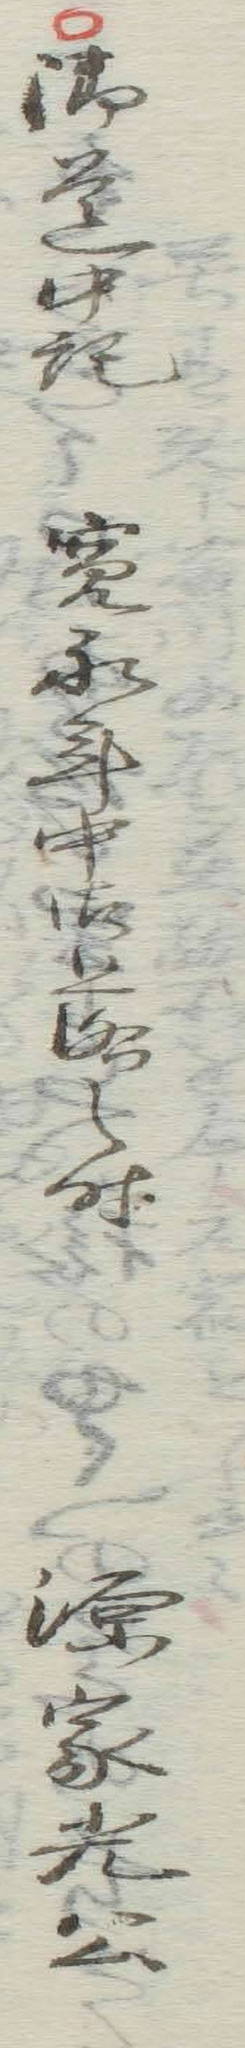○御道中記寛永年中上洛之時源家光公
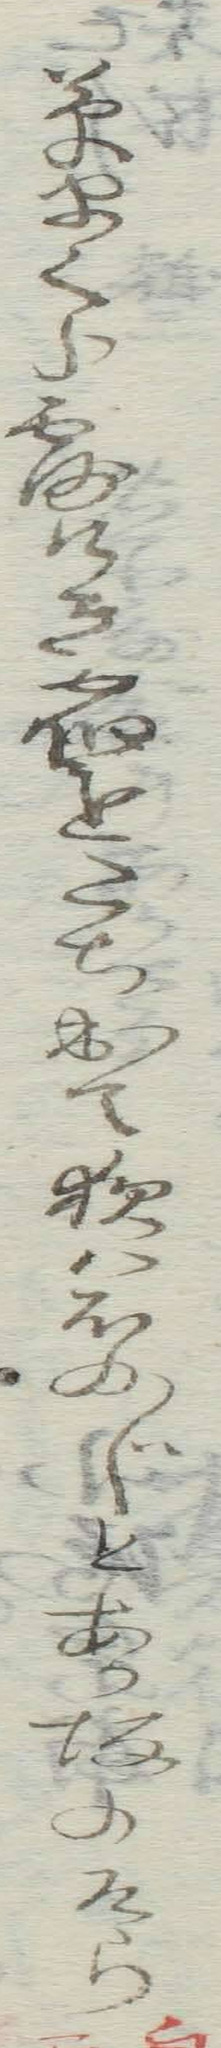草まくら露けき宿をたち出て夜はほの〴〵とあか坂のそら白モ
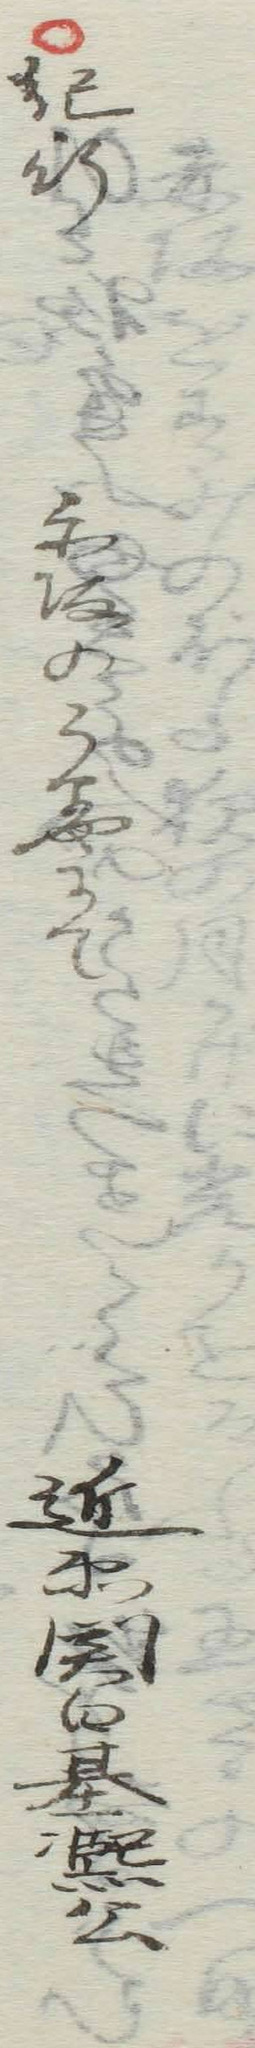○紀行赤坂のうまやにて近衛関白基凞公
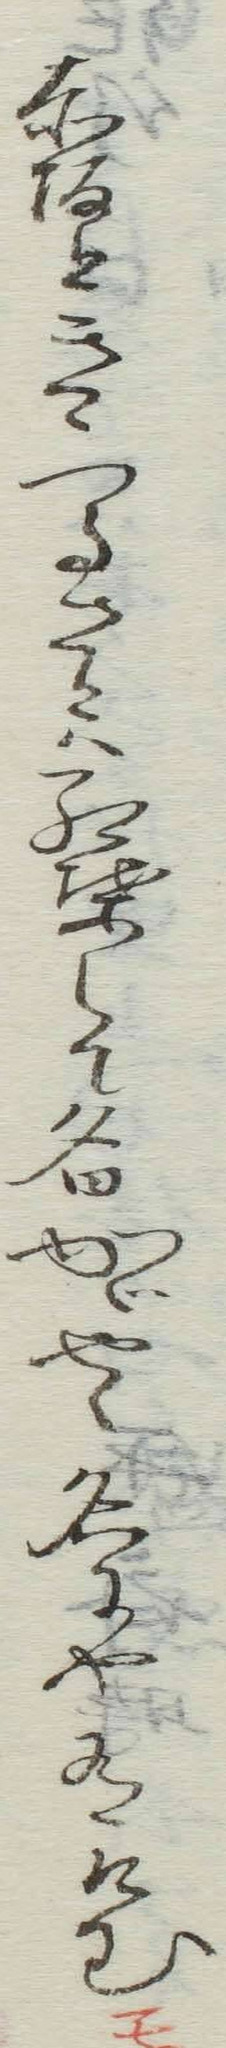赤坂ときゝつるさとは紅葉して夕日かゞやく名にや有けむモ
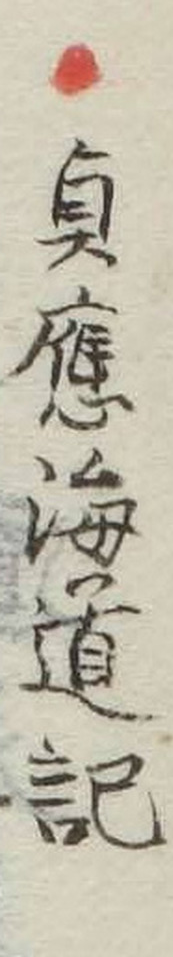●貞應海道記
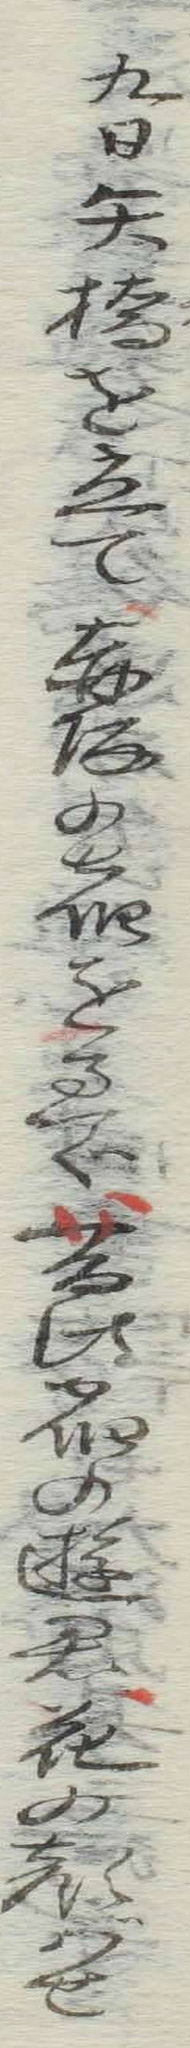九日矢橋を立て、赤坂の宿を過ぐ、昔此宿の遊君、花の顔ばせ
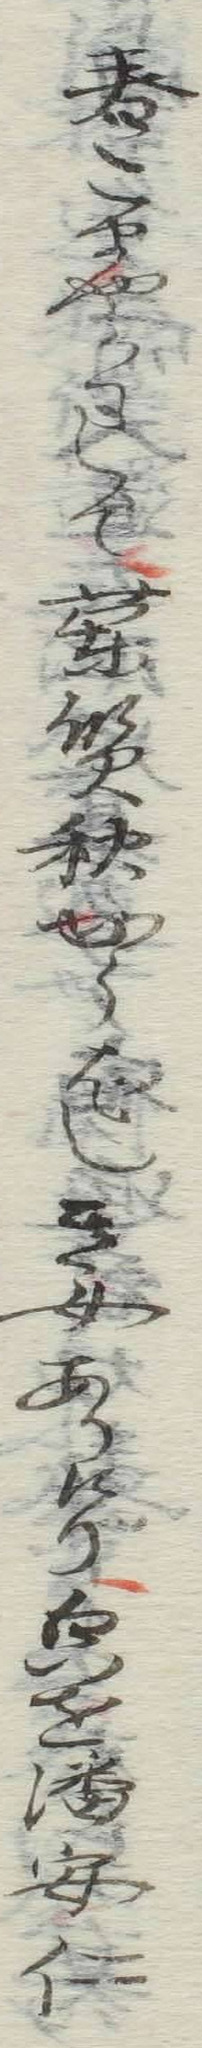春こまやかにして、蘭質秋かうばしき女ありけり、㒵を潘安仁
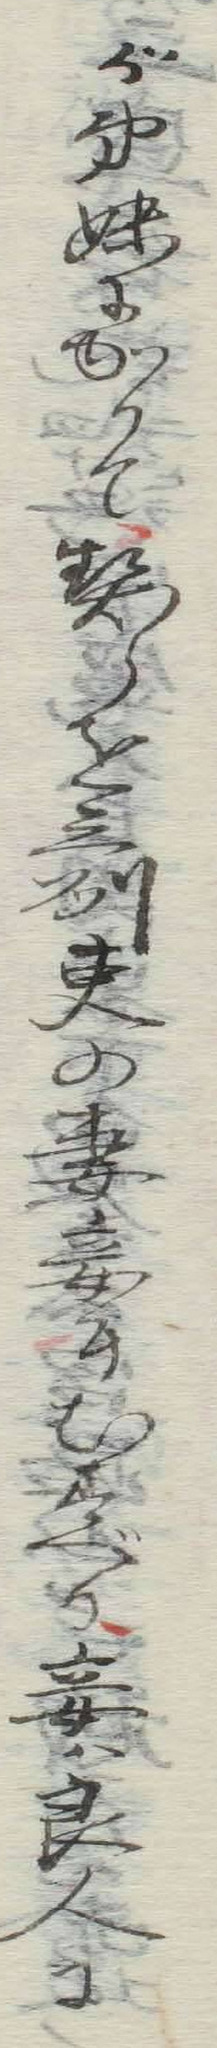が弟妹にかりて、契りを三州吏の妻妾にむすべり、妾は良人に
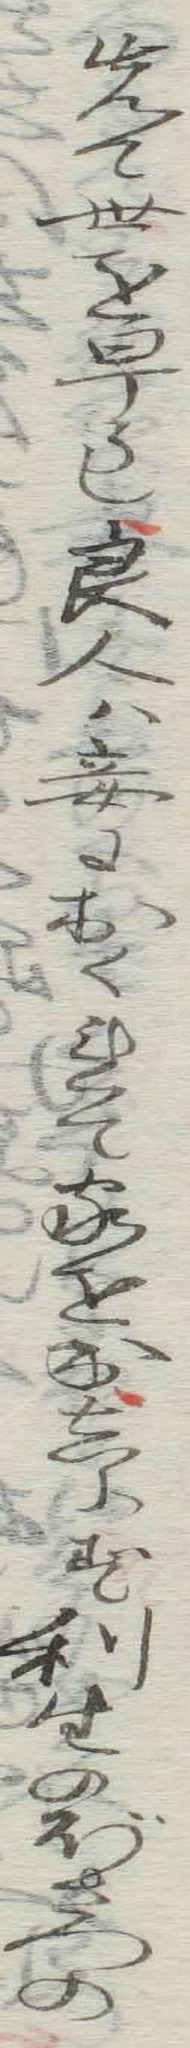先て世を早うし、良人は妾におくれて家を出、しらず利生のぼさつの
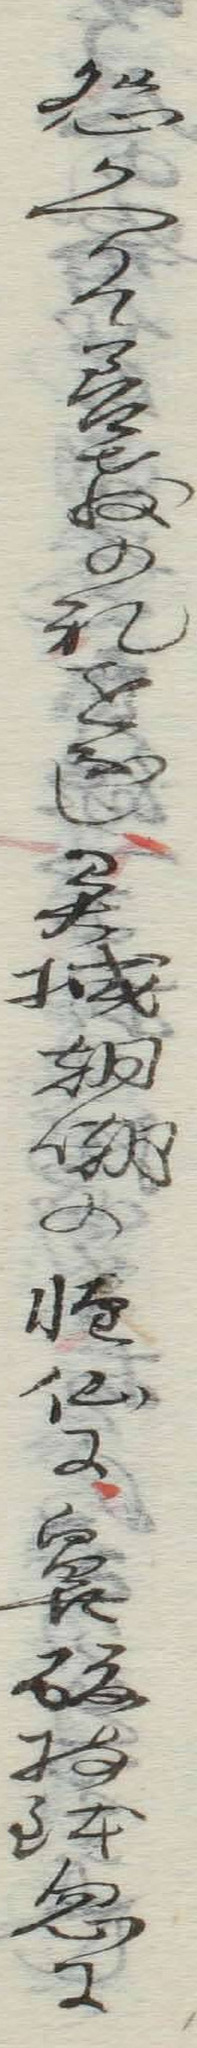怨かへりて善教の礼をなし、異域朝嘲の軽仙に、鼻酸持鉢忽に
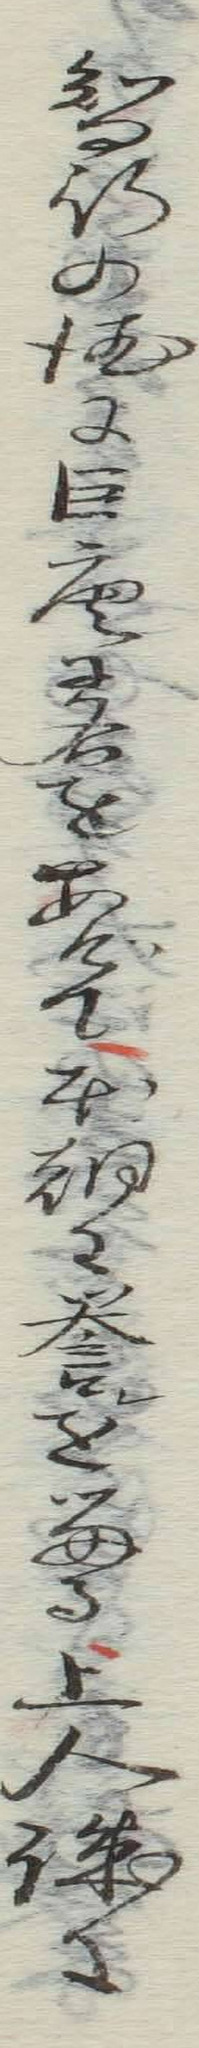智行の徳に巨唐に名をあげて、本朝に誉留る、上人誠に
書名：三河国古跡考
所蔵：国文学研究資料館
